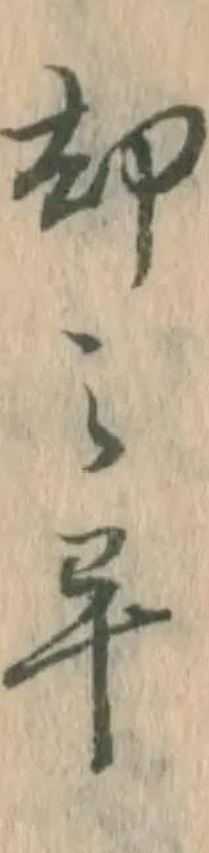却之畢
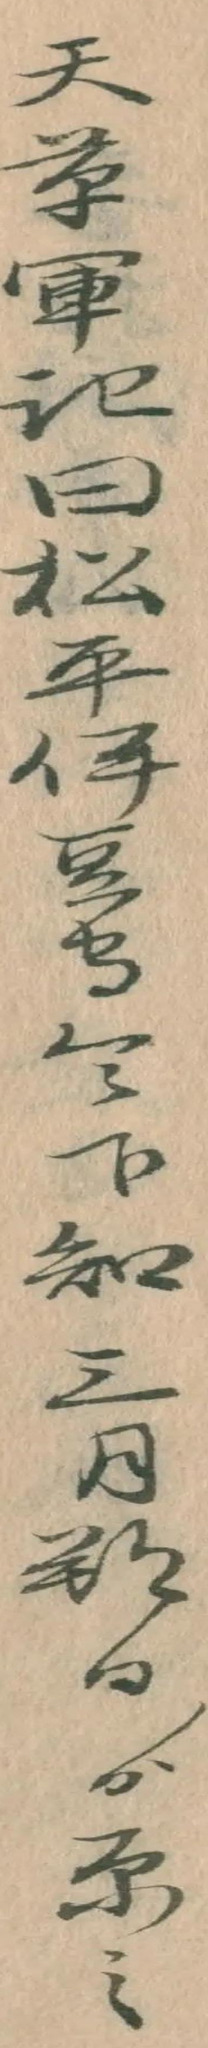天草軍記曰松平伊豆守令下知三月朔日ゟ原之
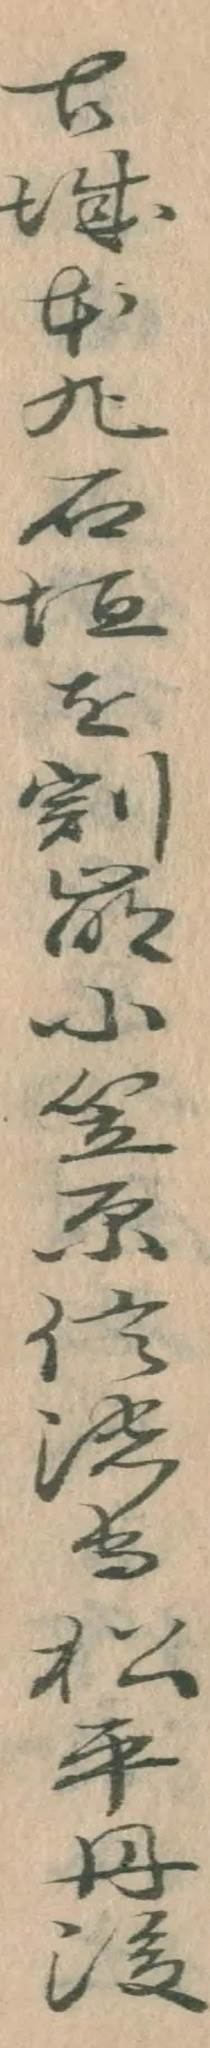古城本丸石垣を割崩小笠原信濃守松平丹後
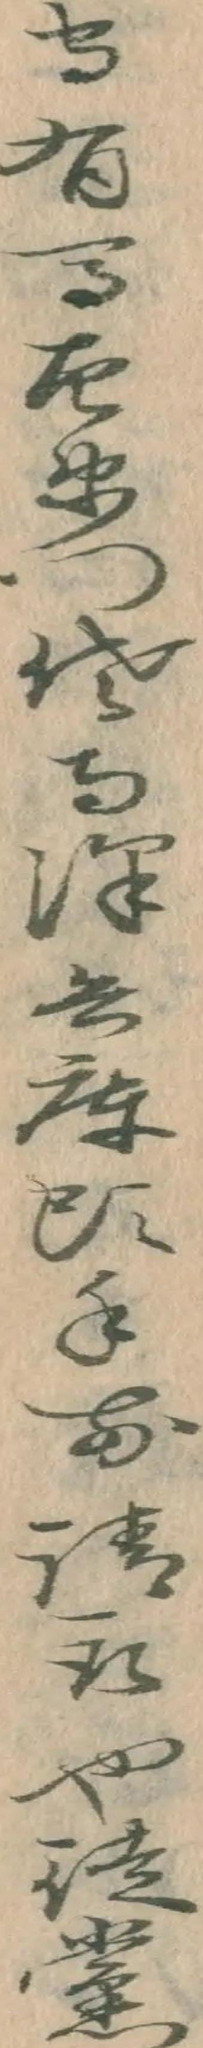守有馬左衛門佐寺沢兵庫頭手前請取也徒党
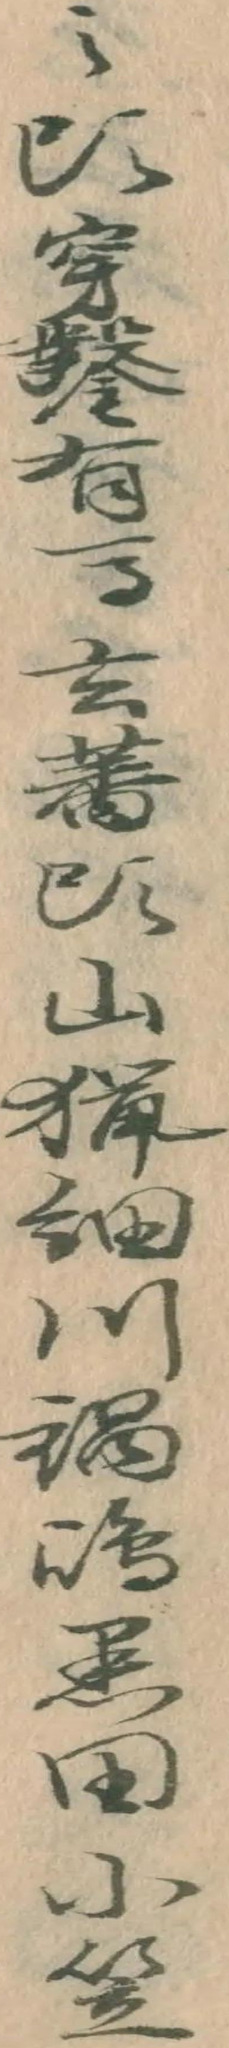之頭穿鑿有馬玄蕃頭山猟細川鍋島黒田小笠

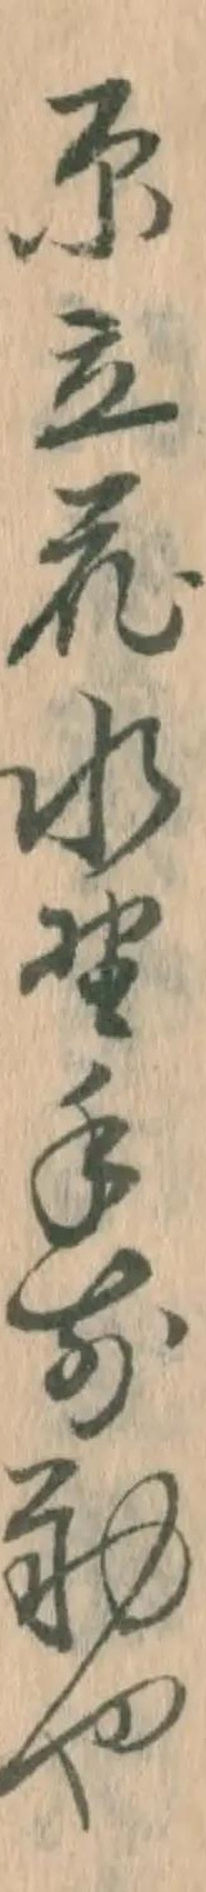原立花水野手前勤也
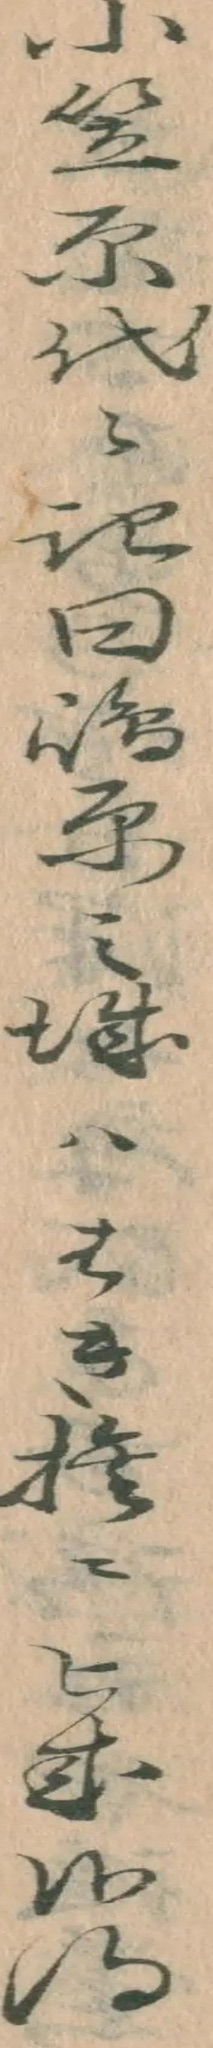小笠原代々記曰島原之城は者き捨に被成候得
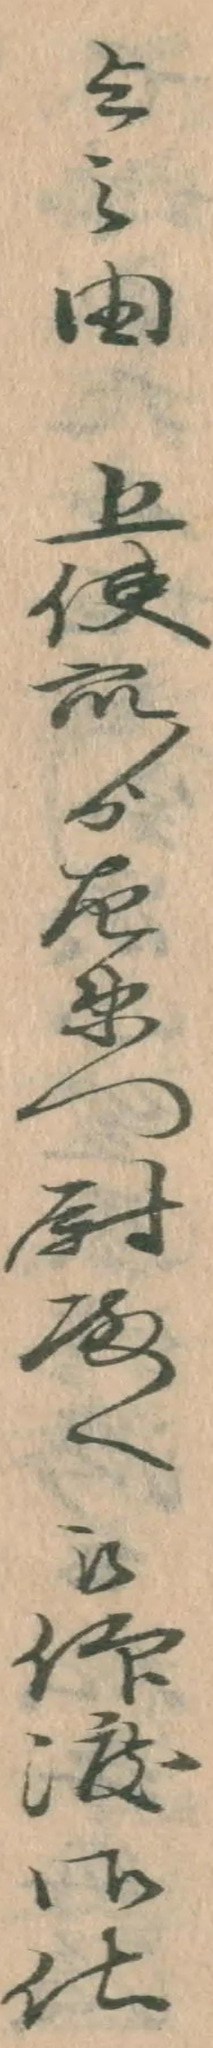与之由上使衆ゟ左衛門尉殿へ被仰渡御仕
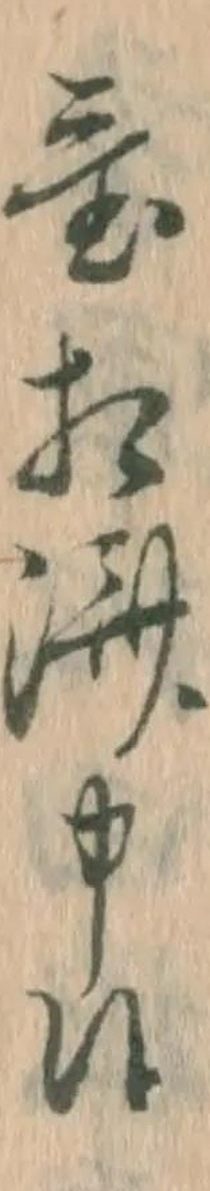置相済申候
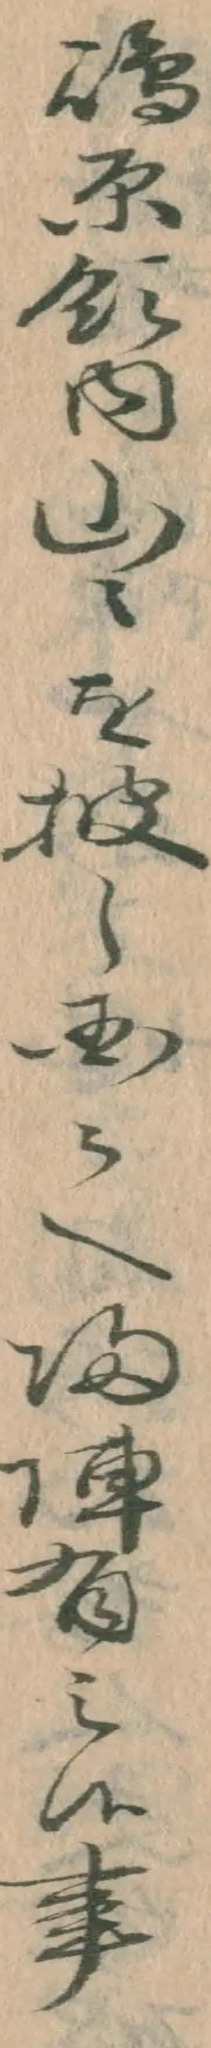島原領内山々を披し国々へ帰陣有之候事
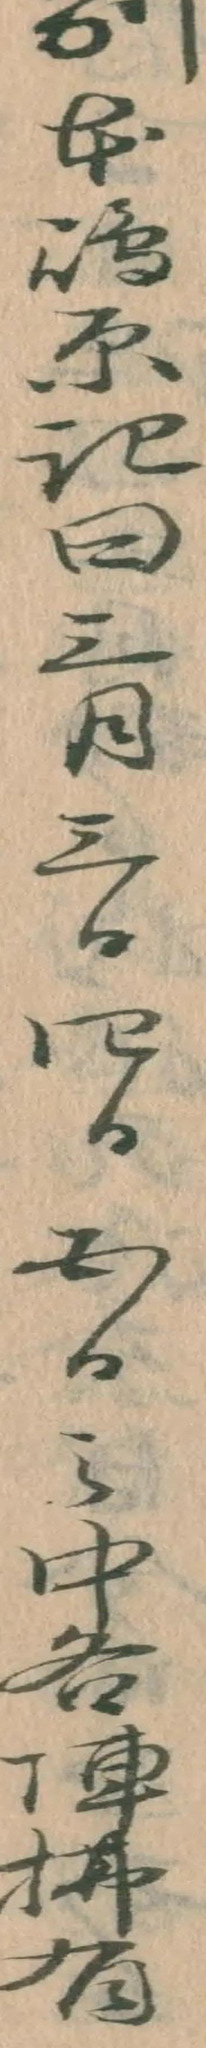別本島原記曰三月三日四日五日之中各陣払有
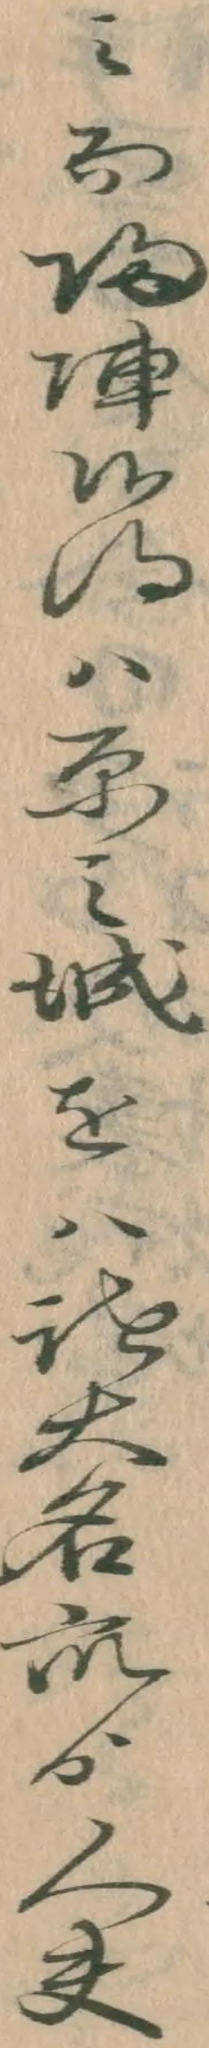之而帰陣候得は原之城をは諸大名衆ゟ人夫
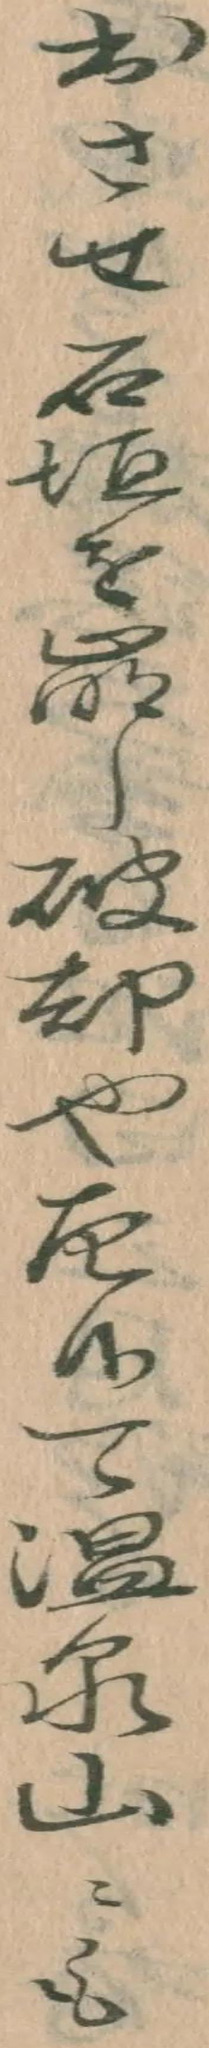出させ石垣を崩し破却也左候て温泉山にも
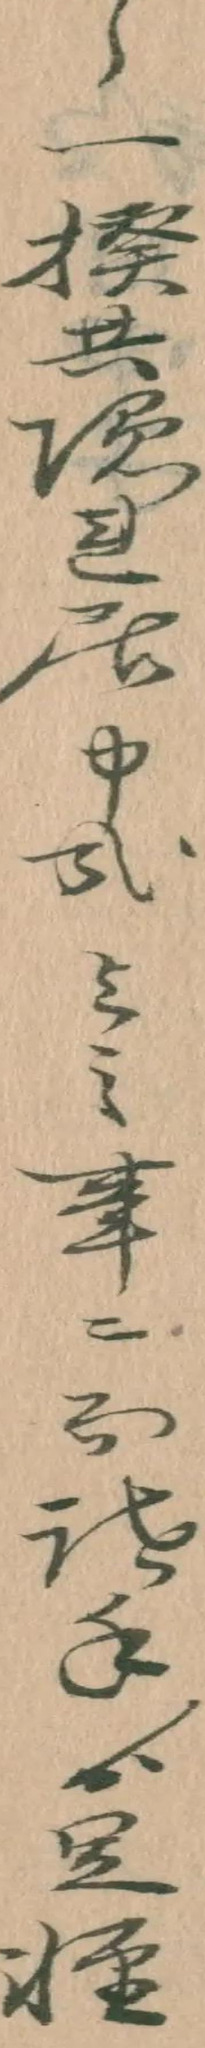し一揆共隠連居申哉与之事に而諸手ゟ足軽
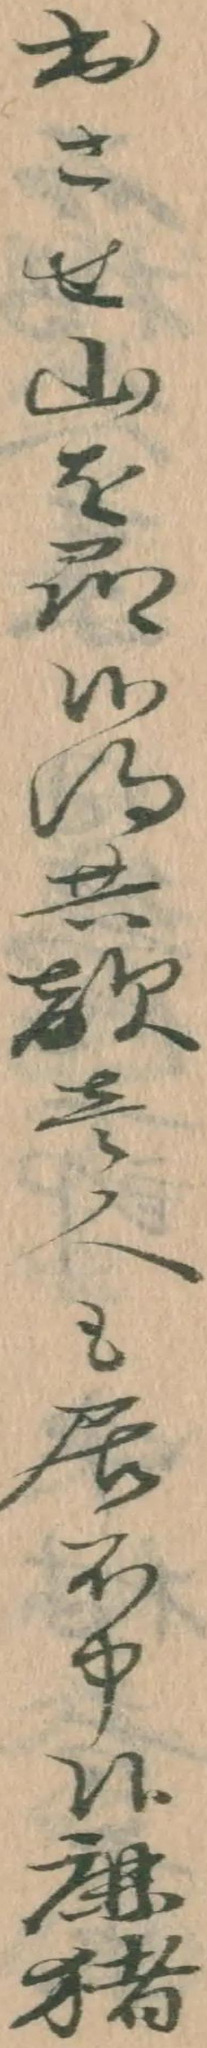出させ山を尋候得共敵壱人も居不申候廉猪
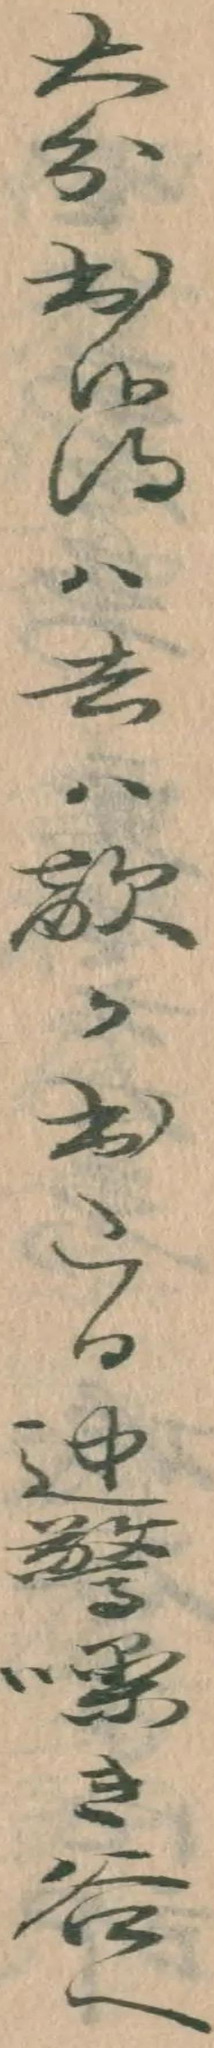大分出候得は去は敵か出たる迚驚噪き谷へ
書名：切支丹御退治記 49巻. [9]
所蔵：国立国会図書館 National Diet Library, JAPAN
